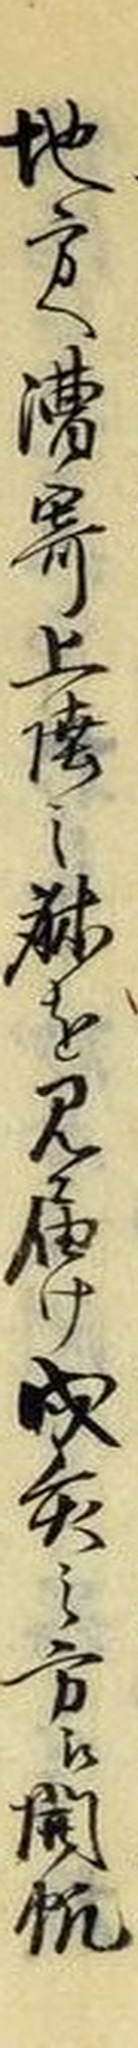他方へ漕寄上陸之躰を見届け戌亥之方江開帆
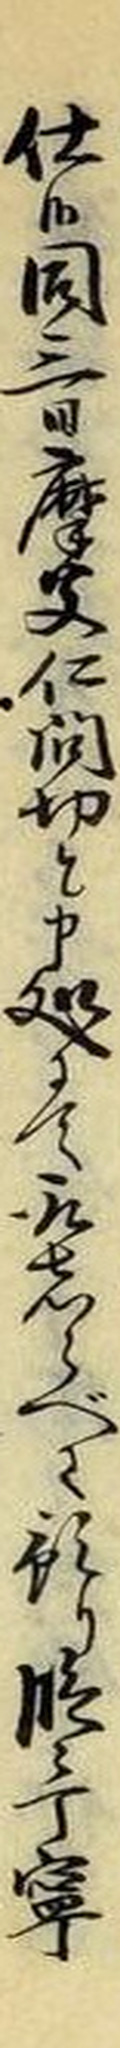仕候同三日摩文仁問切と申処にて取しらべに預り段々丁寧
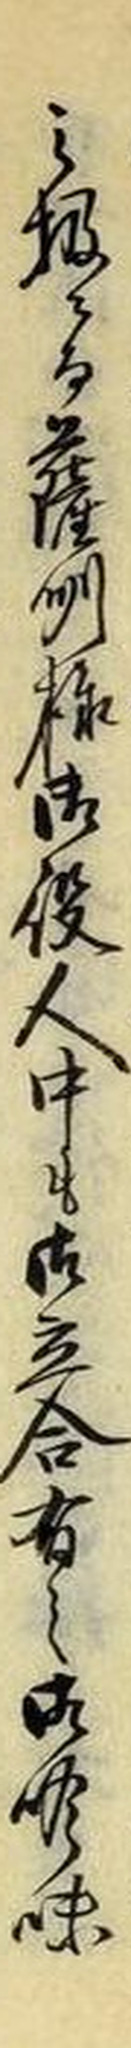之扱二而薩州様御役人中も御立合有之御吟味
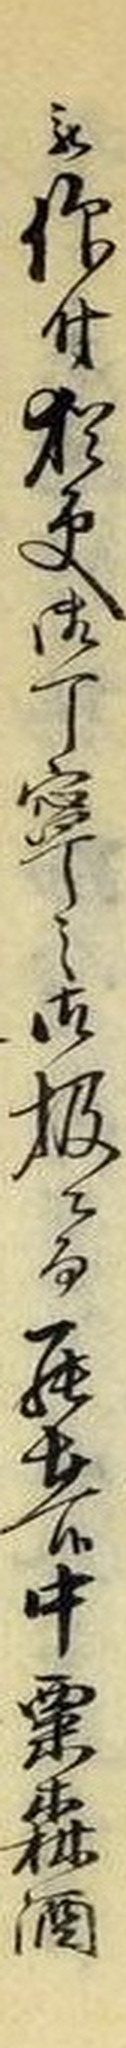被仰付猶更御丁寧之御扱二而罷在候中粟森酒
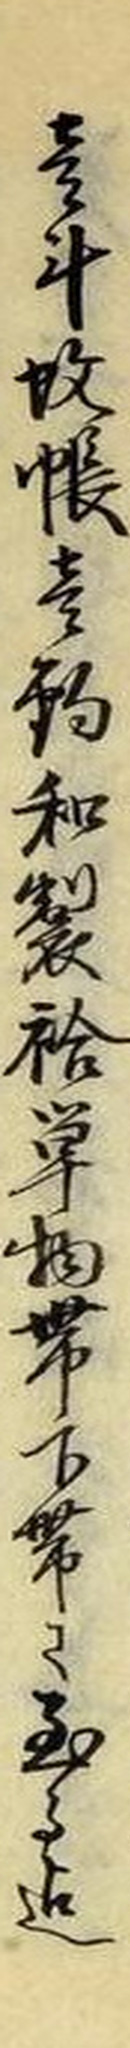一斗蚊帳一釣和製袷単物帯下帯に至る迠
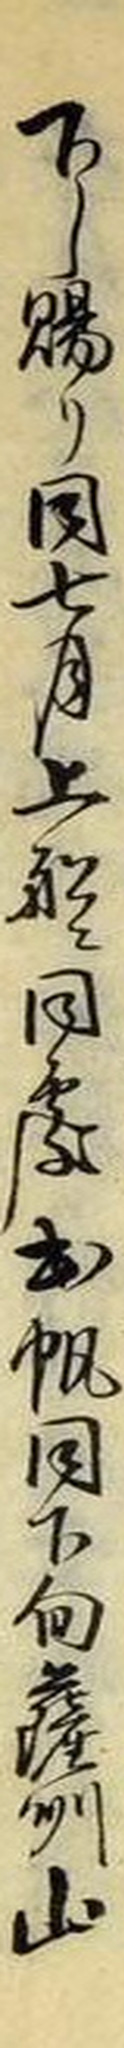下し賜り同七月上船と同處出帆同下旬薩州山
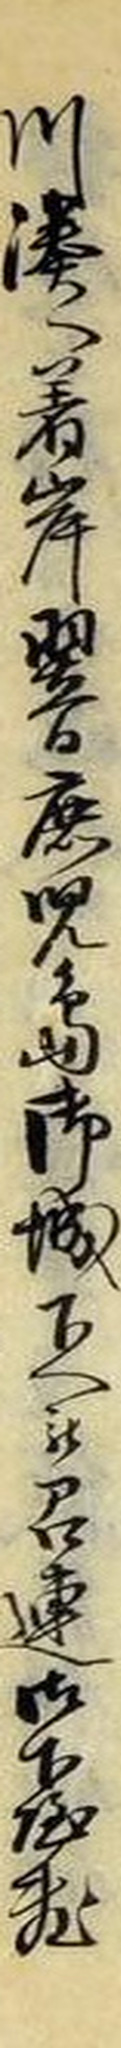川湊へ着岸翌日鹿児島御城下へ召連御下屋敷
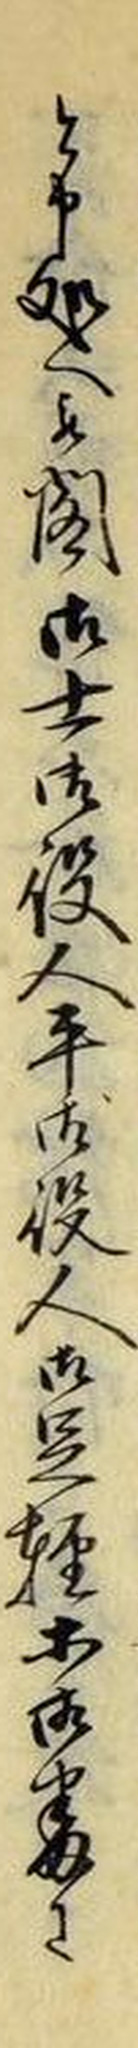と申処へ被閣御士御役人平御役人御足軽等御番に

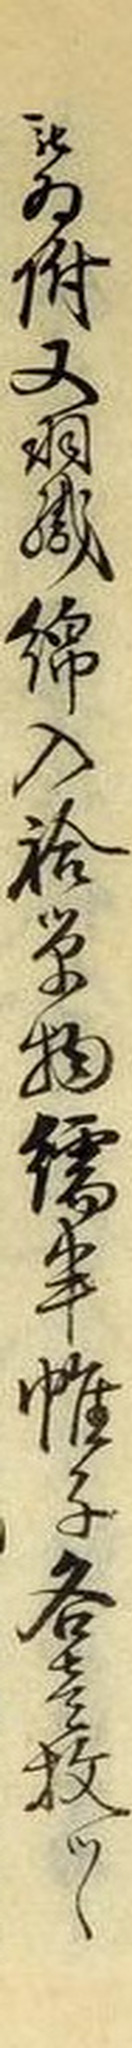被ゐ附又羽織綿入袷単物襦袢帷子各一枚ツヽ
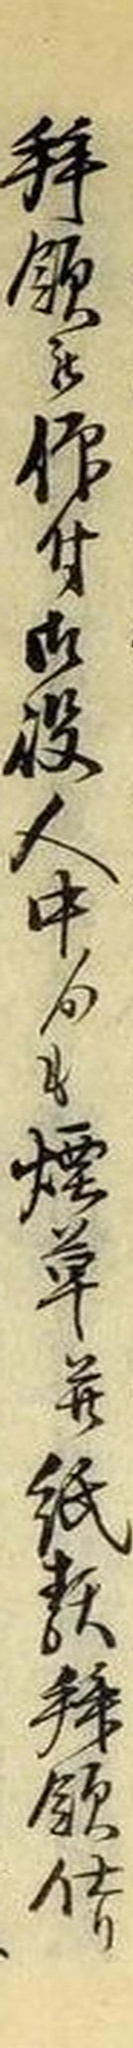拝領被仰付御役人中ゟも煙草幷紙類拝領仕り
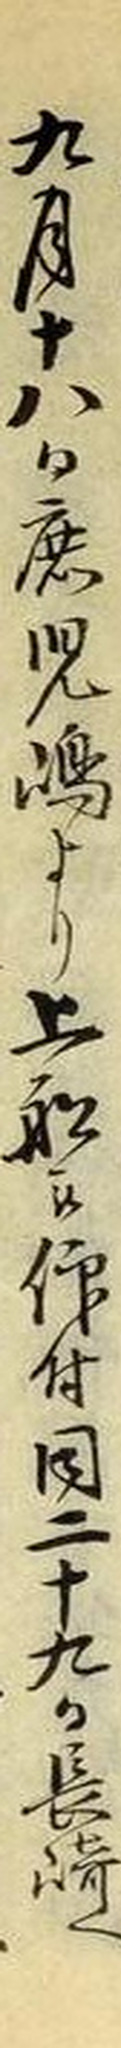九月十八日鹿児島より上船被仰付同二十九日長崎へ
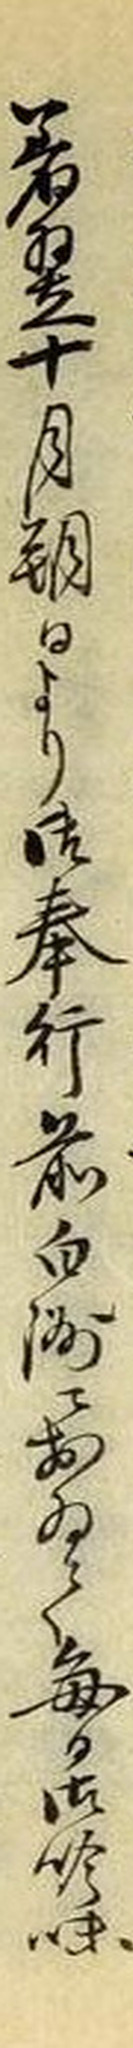着翌十月朔日より御奉行前白洲二おいて毎日御吟味
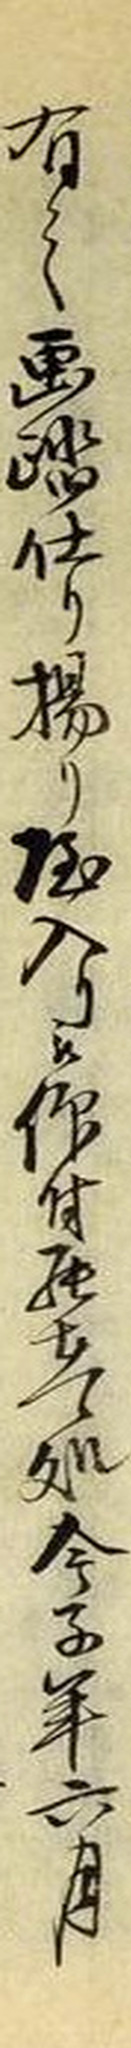有之画踏仕り揚り屋入り被仰付罷在候処今子年六月
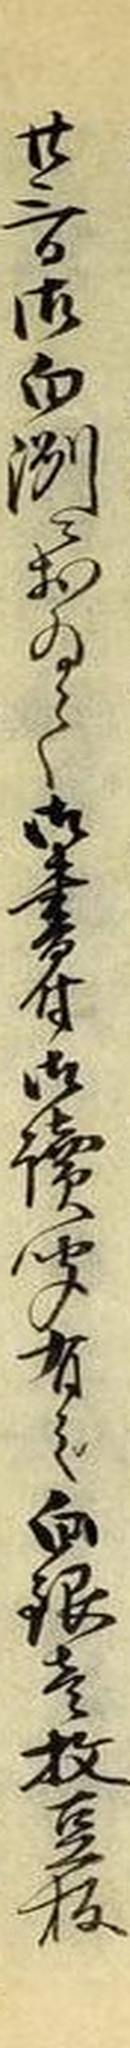廿三日御白洲ニおいて御書付御読聞有之白銀一枚豆板
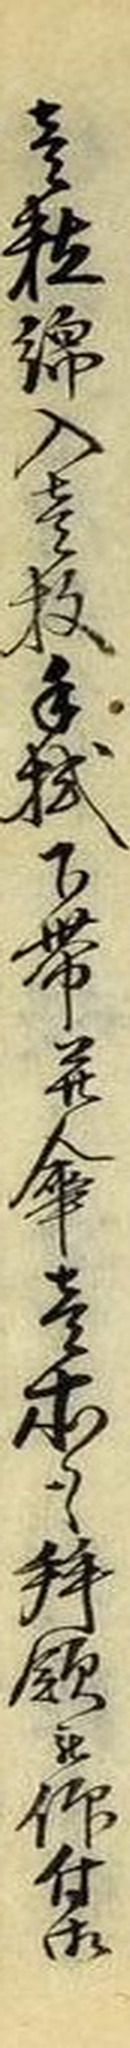一粒綿入一枚手拭下帯幷傘一本も拝領被仰付御
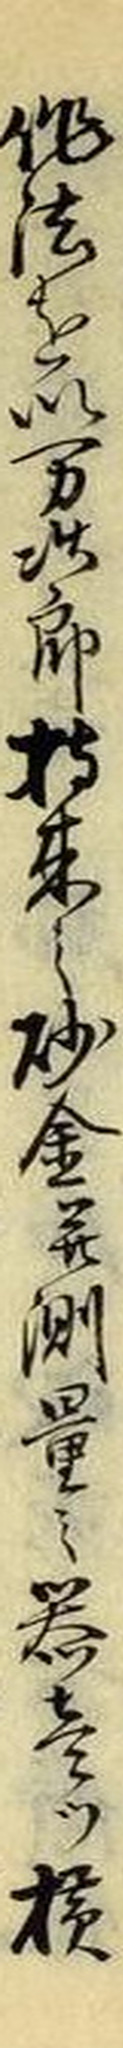作法を以万次郎持来之砂金幷測量之器一ツ横
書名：漂客談奇（備考雑録写8）
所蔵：福井県文書館 Fukui Prefectural Archives
